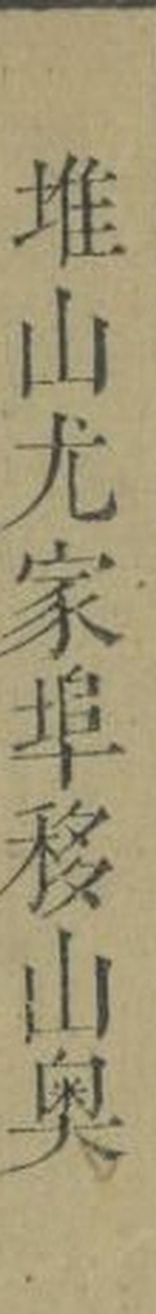堆山尤家埠移山奥
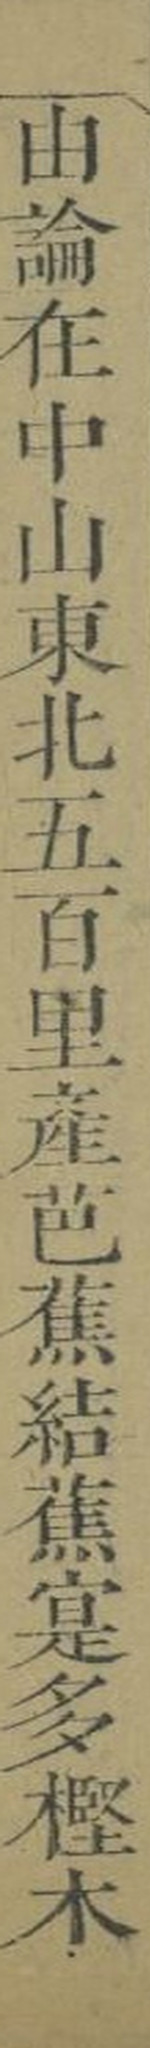[由論]在中山東北五百里産芭蕉結蕉寔多樫木
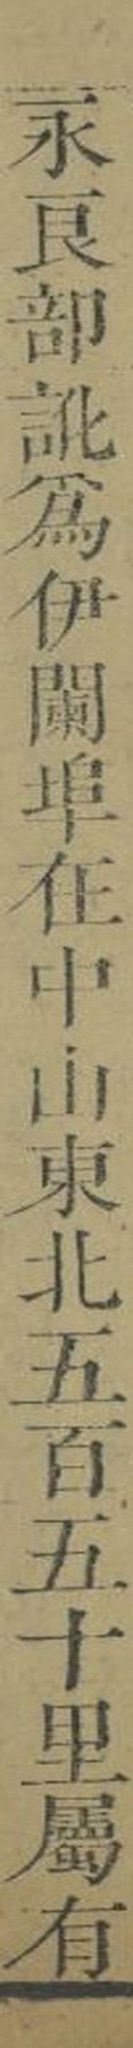[永良部]訛為伊闌埠在中山東北五百五十里属有
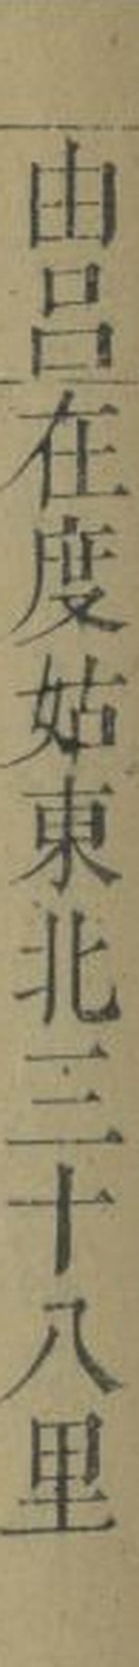[由呂]在度姑東北三十八里
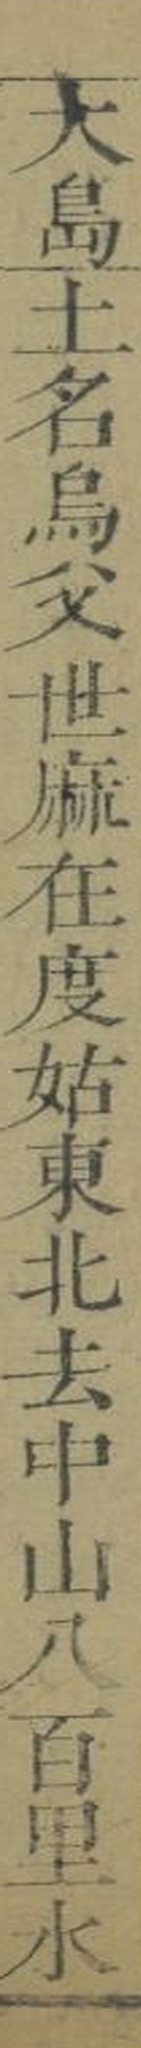[大島]土名烏父世麻在度姑東北去中山八百里水
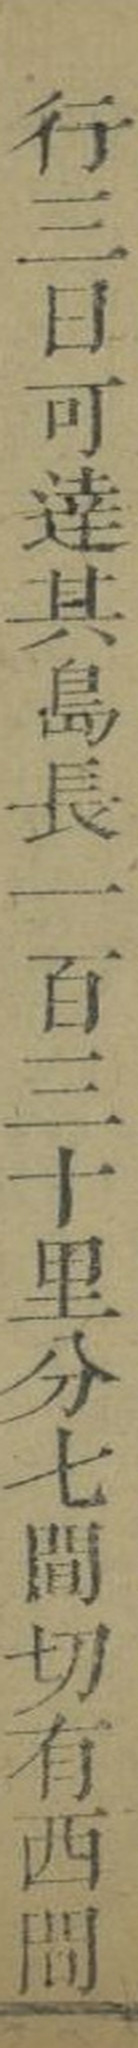行三日可達其島長一百三十里分七間切有西間
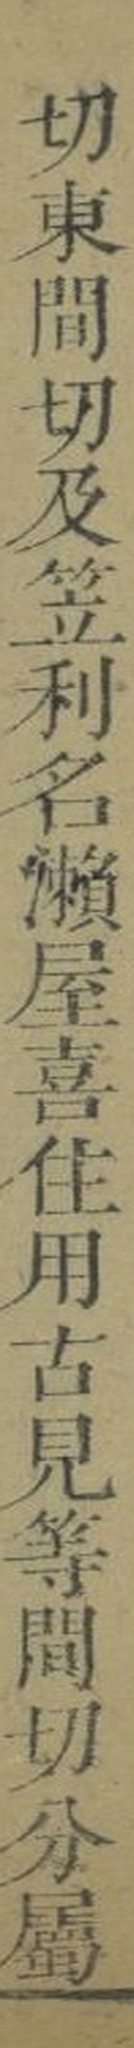切東間切及笠利名瀬屋喜住用古見等間切分属
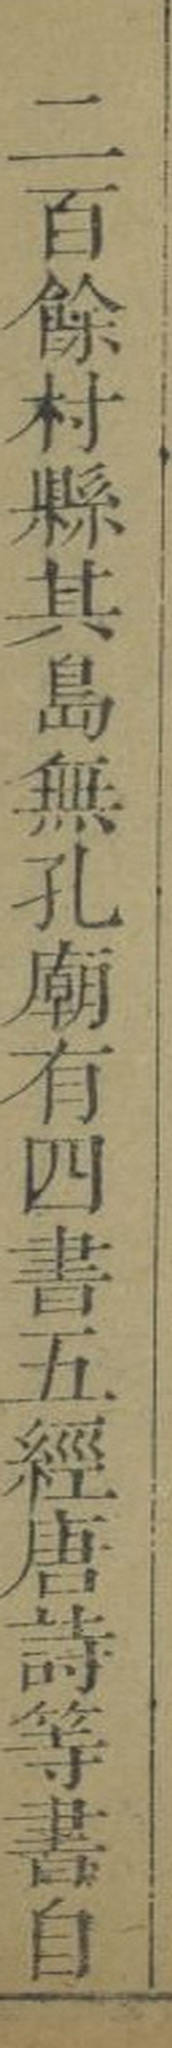二百余村県其島無孔廟有四書五経唐詩等書自
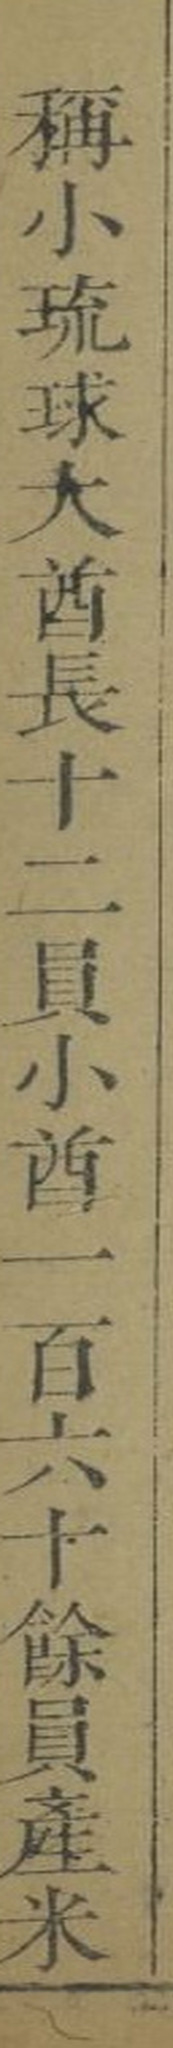称小琉球大酋長十二員小酋一百六十余員産米

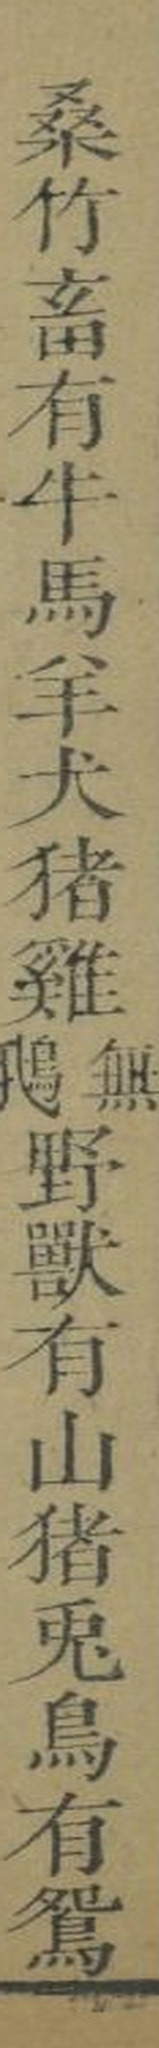桑竹畜有牛馬羊犬猪鶏無鵝野獣有山猪兎鳥有鴛
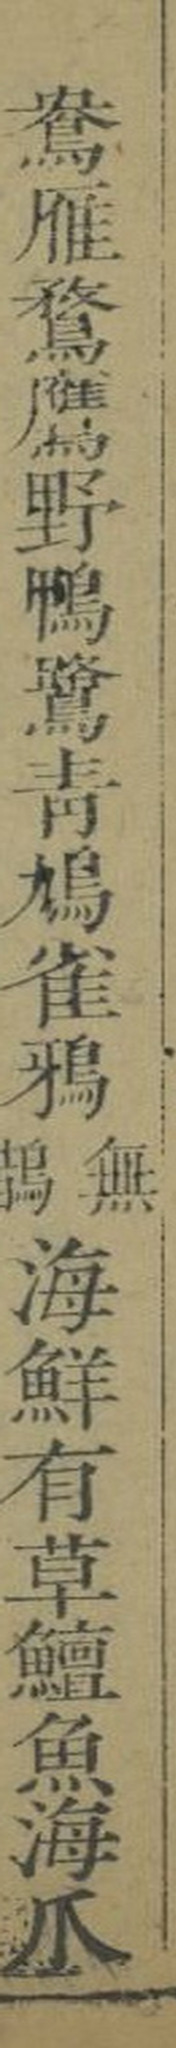鴦雁鶩鷹野鴨鷺青鳩雀鴉無鵲海鮮有草鱣魚海爪
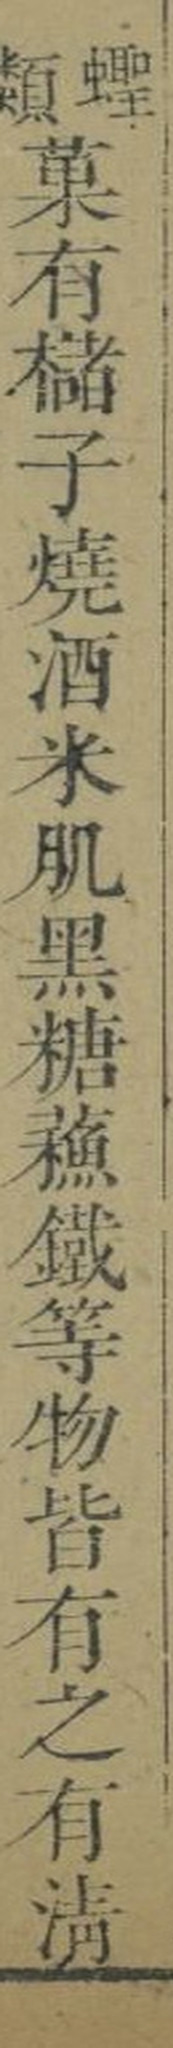蟶類菓有櫧子焼酒米肌黒糖蘇鉄等物皆有之有清
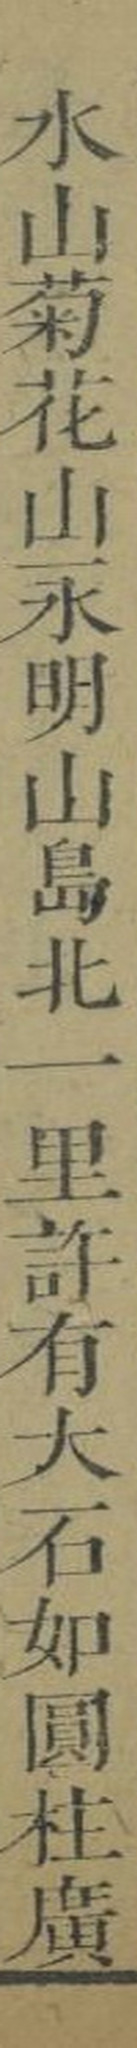水山菊花山永明山島北一里許有大石如円柱広
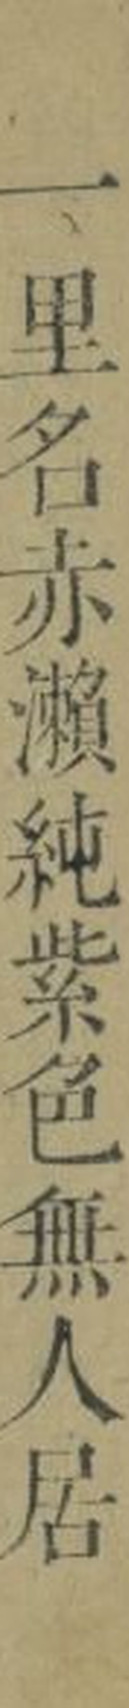一里名赤瀬純紫色無人居
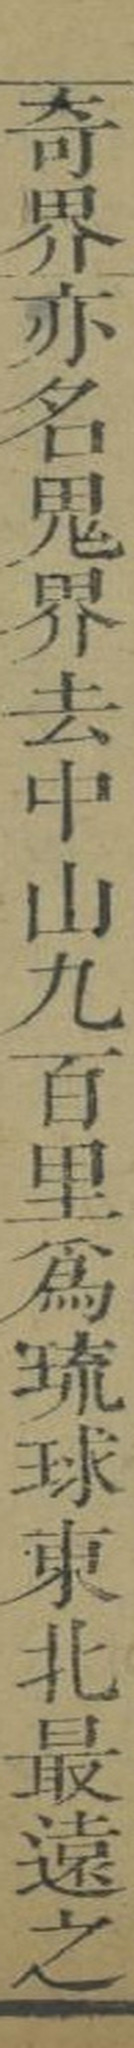[奇界]亦名鬼界去中山九百里為琉球東北最遠之
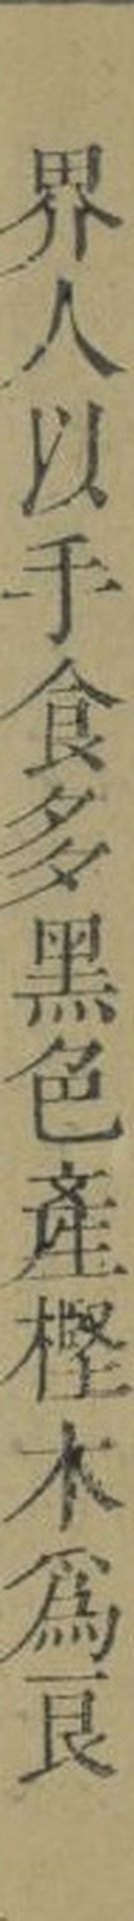界人以手食多黒色産樫木為良
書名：中山伝信録 巻四
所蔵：University of the Ryukyus Library
